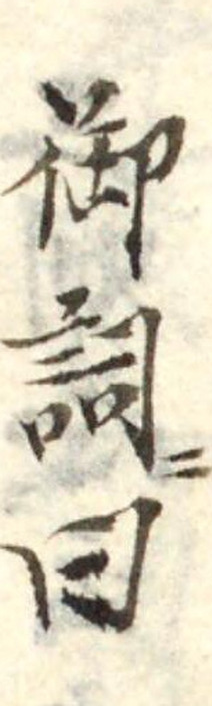御詞に曰
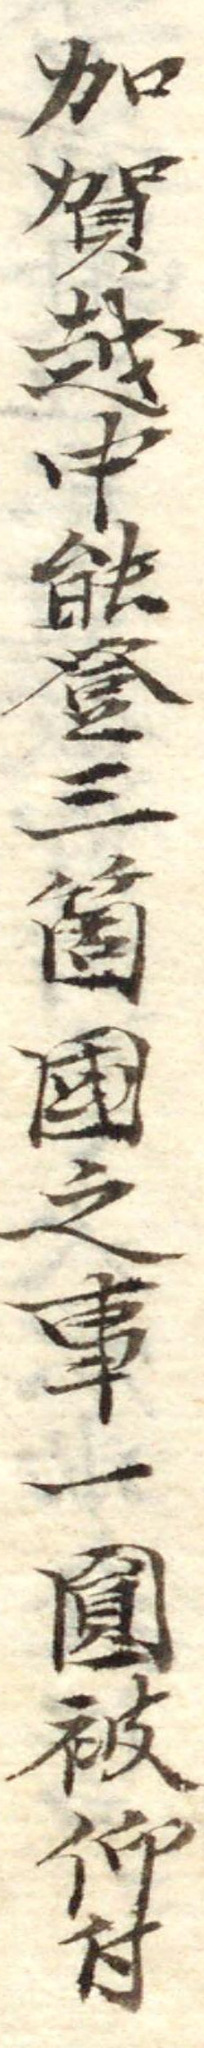加賀越中能登三箇国之事一円被仰付
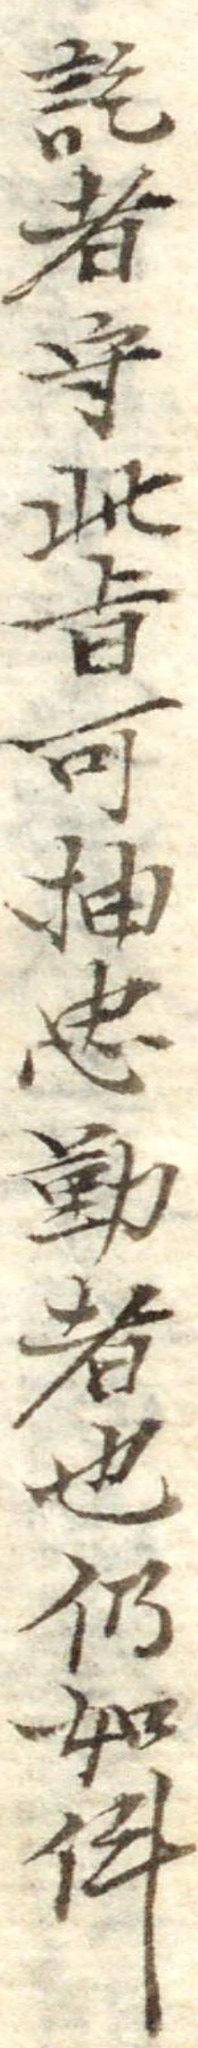訖者守此旨可抽忠勤者也仍如件
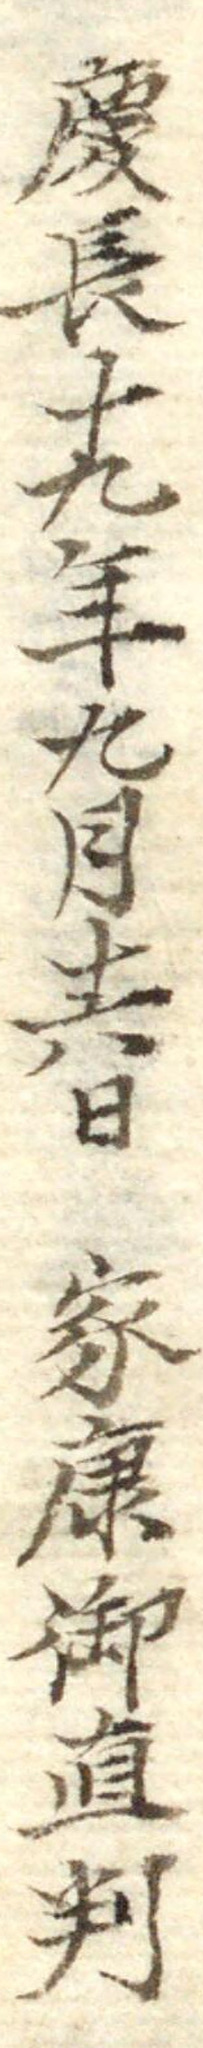慶長十九年九月十六日家康御直判

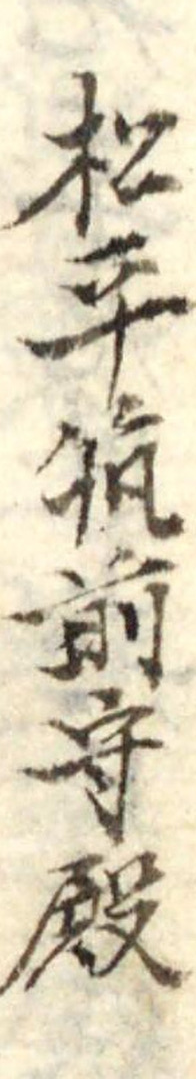松平筑前守殿
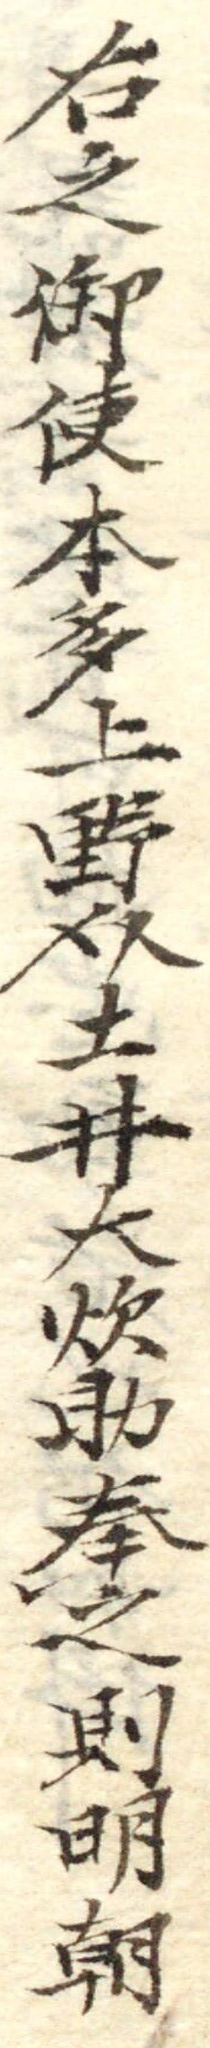右御使本多上野介土井大炊助奉之則明朝
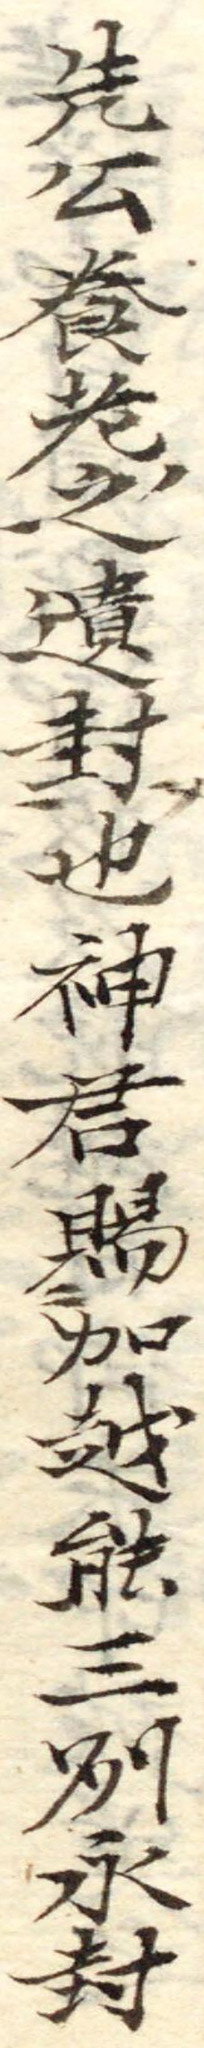先公養老之遺封を也神君賜加越能三州永封
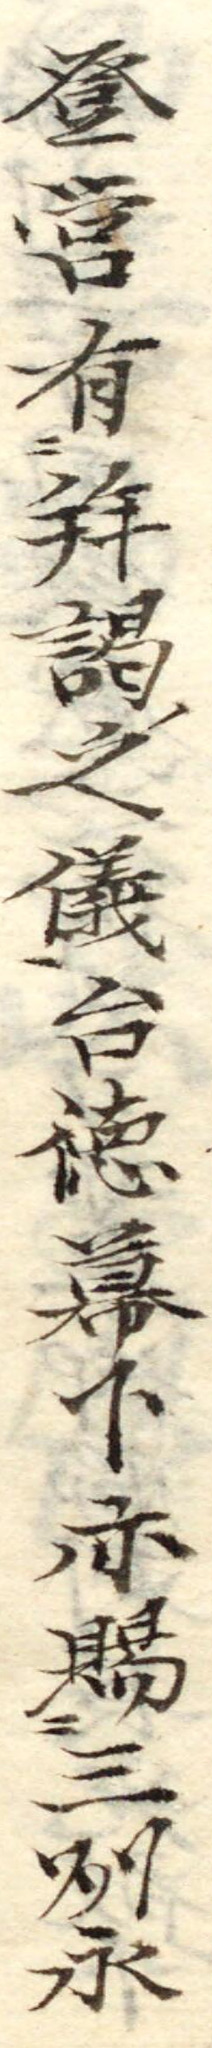登営有拝謁之儀台徳幕下亦賜三州永
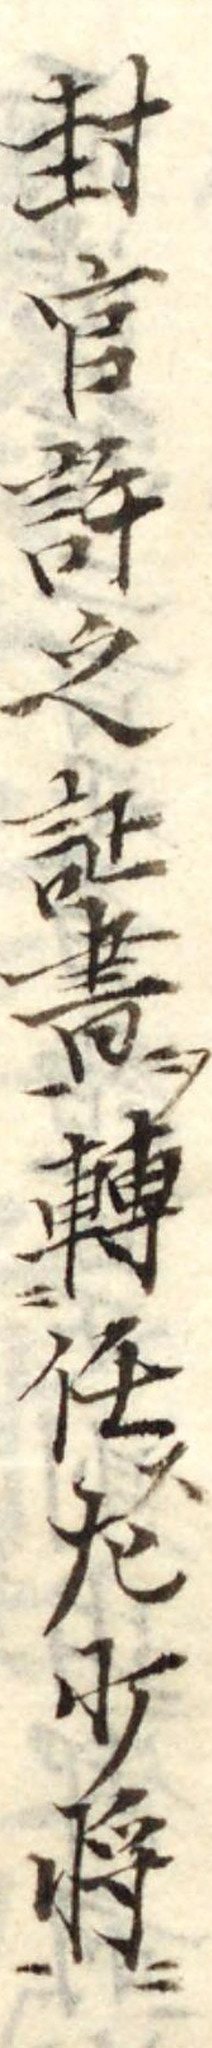封官許之証書を轉任す左少将に
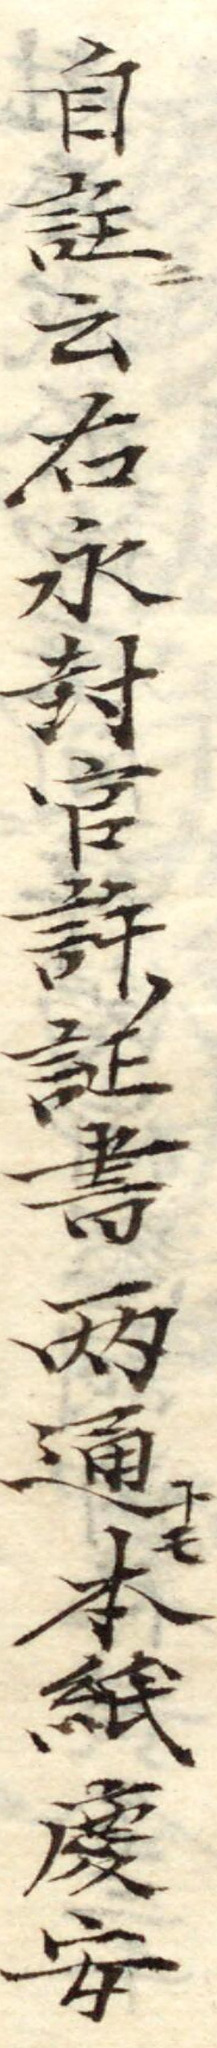自註に云右永封官許の証書両通とも本紙慶安
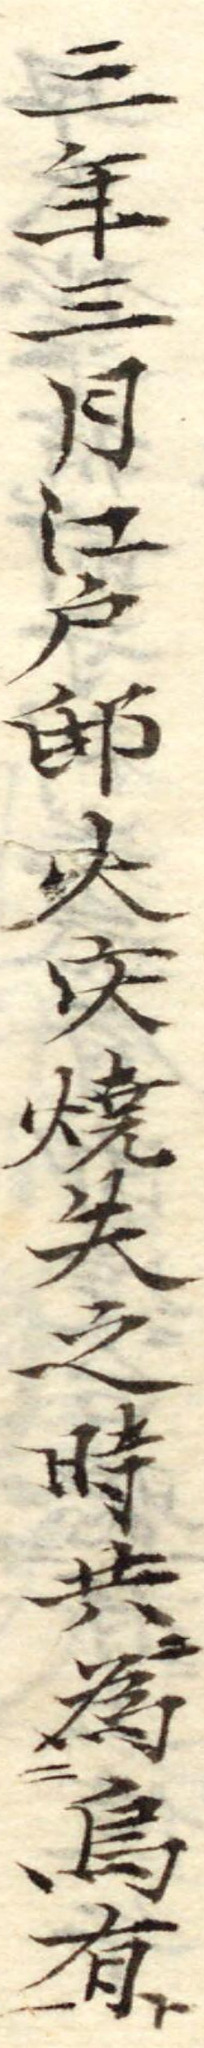三年三月江戸邸火灾焼失之時共に為烏有と
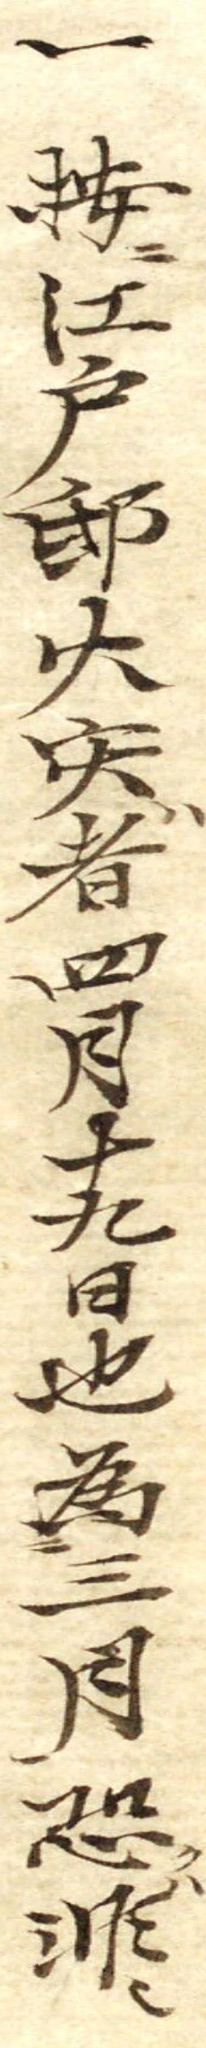一按に江戸邸火灾者四月十九日也為三月恐くは非也
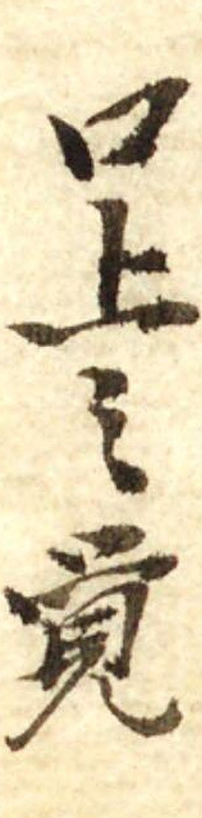口上之覚
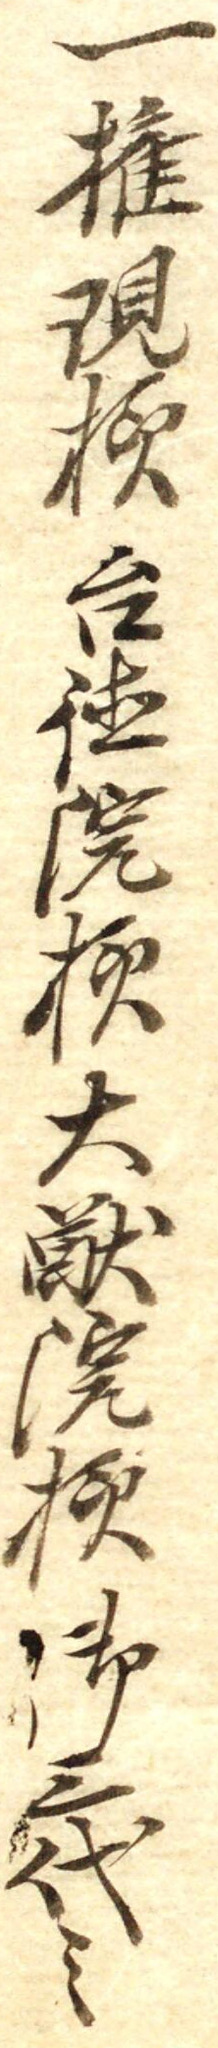一権現様台徳院様大獻院様御三代之
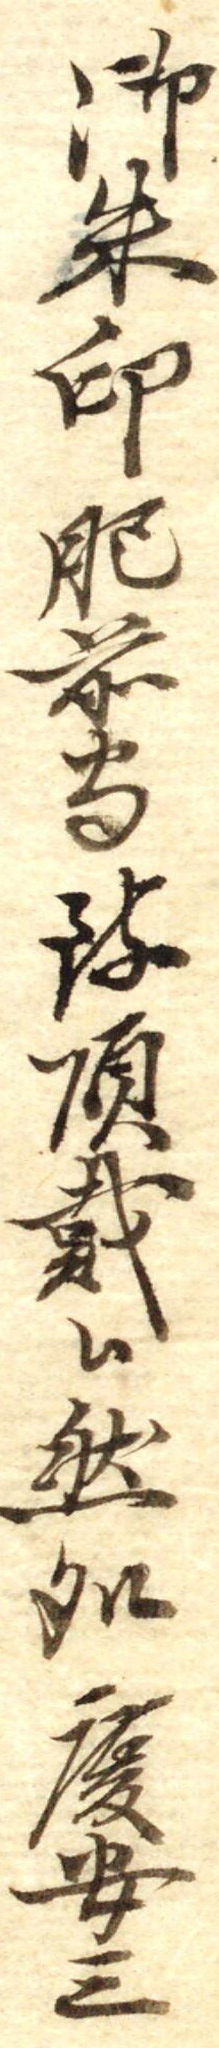御朱印肥前守致頂戴候然処慶安三
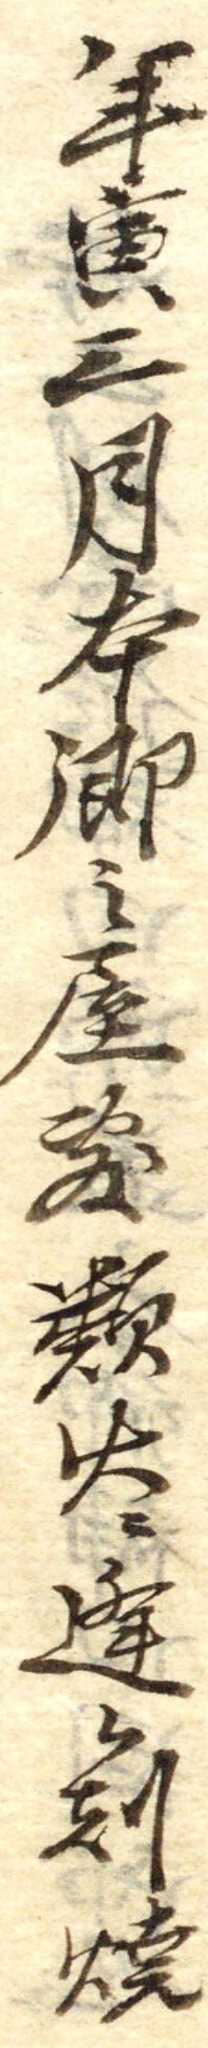年寅三月本郷之屋敷類火に逢候刻焼
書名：前田家封国証書集録
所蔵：Ishikawa Prefectural Library
